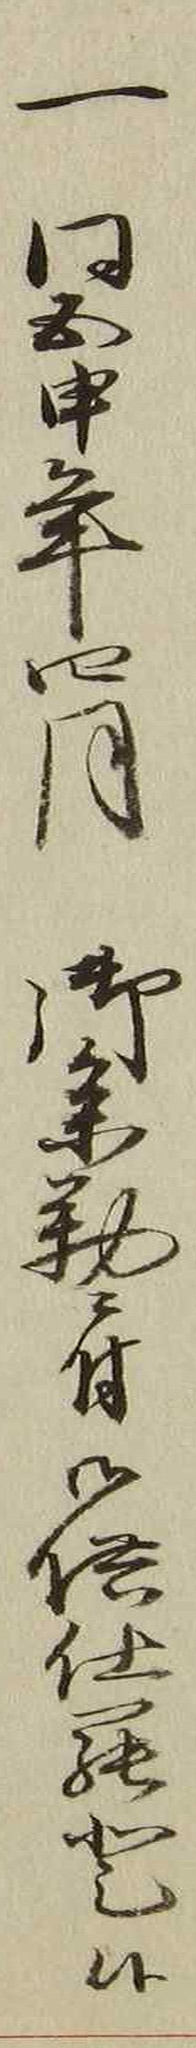一同五申年四月御参勤ニ付御供仕罷登候
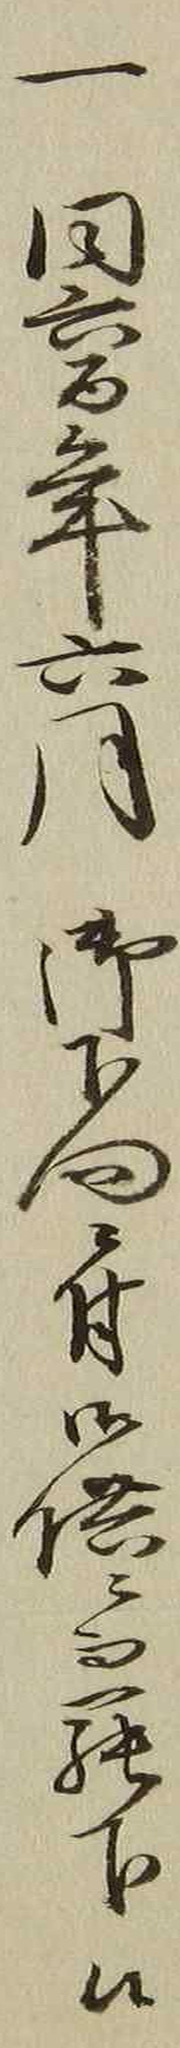一同六酉年六月御下向ニ付御供ニ而罷下候
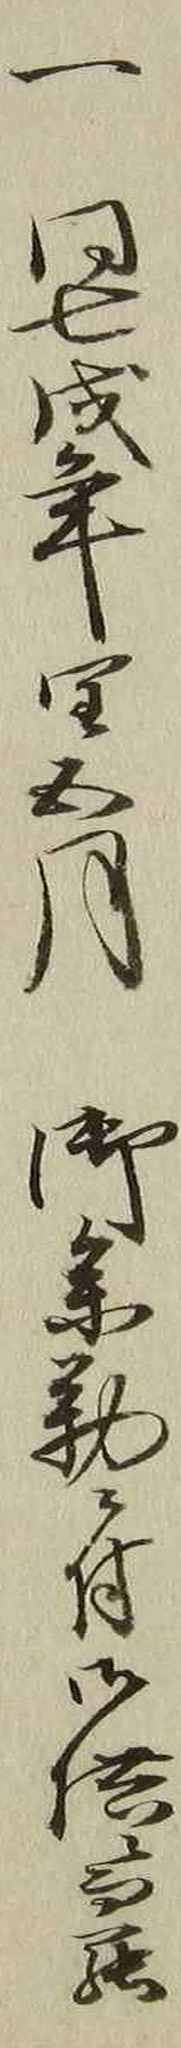一同七戌年閏五月御参勤ニ付御供ニ而罷
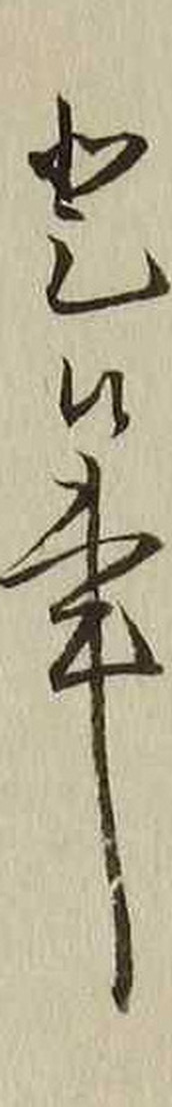登候事
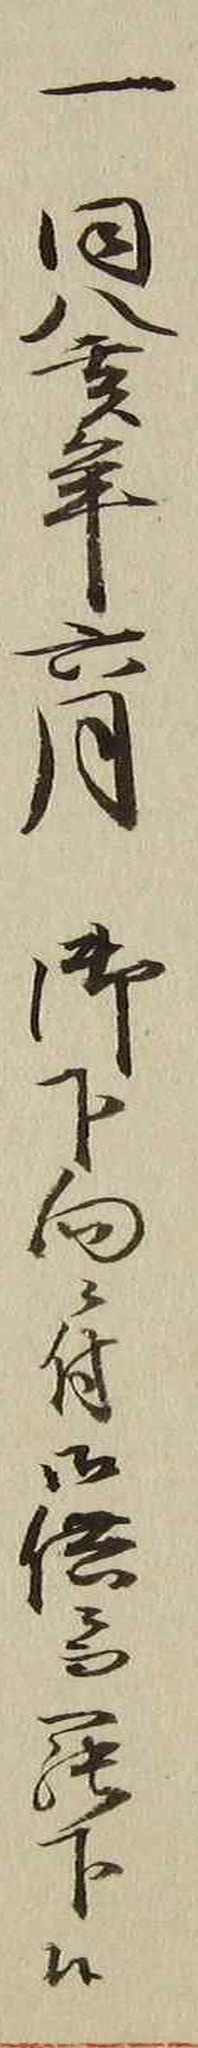一同八亥年六月御下向ニ付御供ニ而罷下候
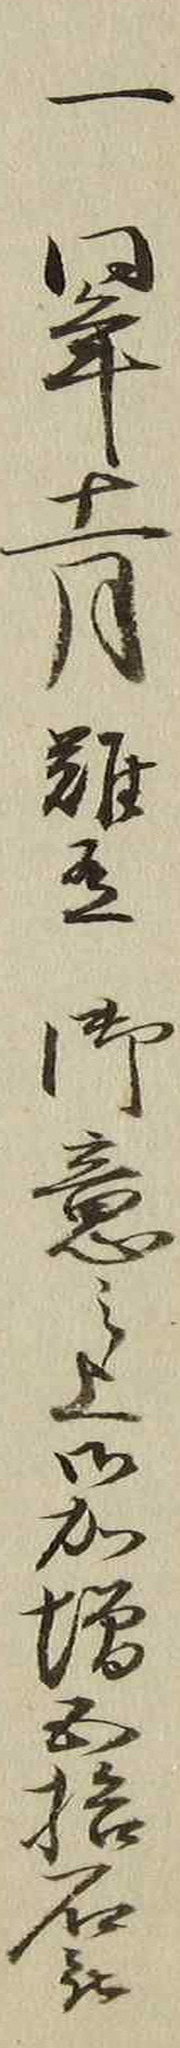一同年十一月難有御意之上御加増五拾石被
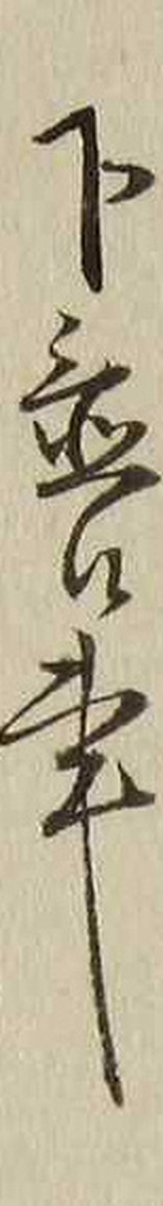下置候事
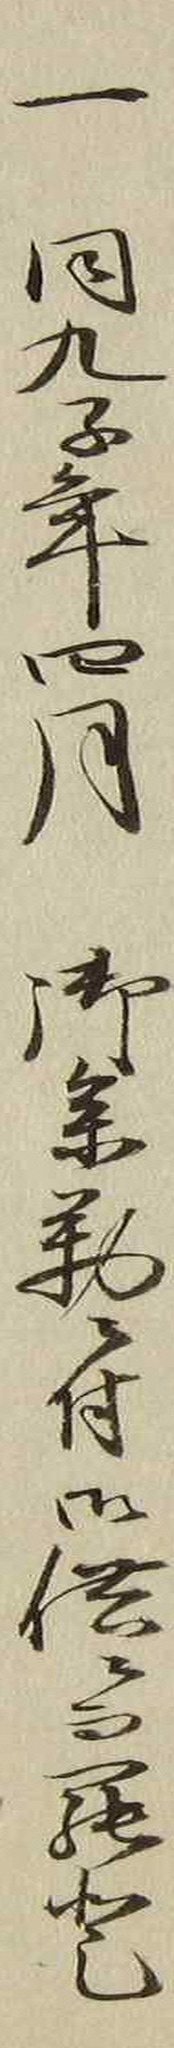一同九子年四月御参勤ニ付御供ニ而罷登
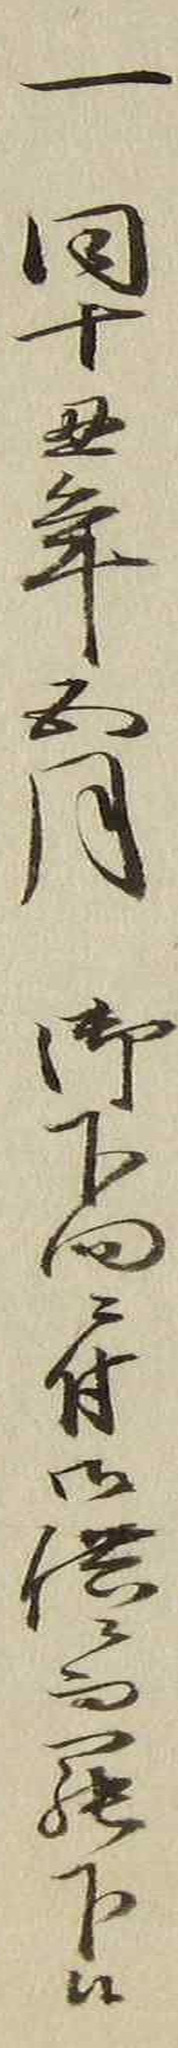一同十丑年五月御下向ニ付御供ニ而罷下候
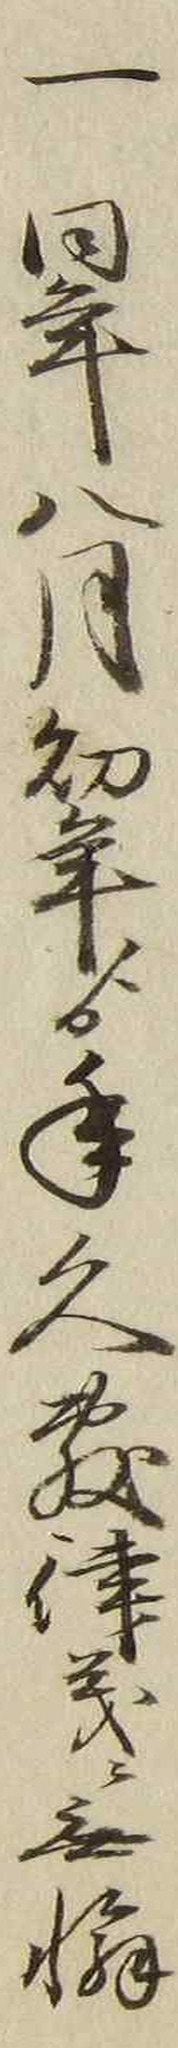一同年八月初年ゟ年久敷律儀ニ無懈
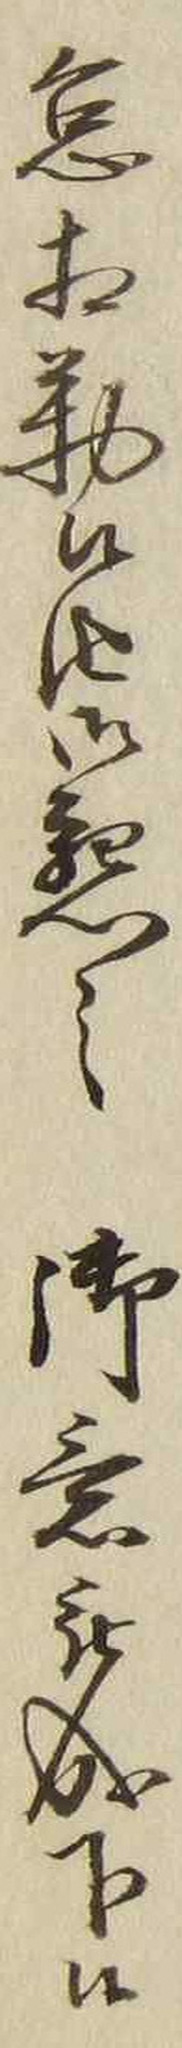怠相勤候由御懇之御意被成下候

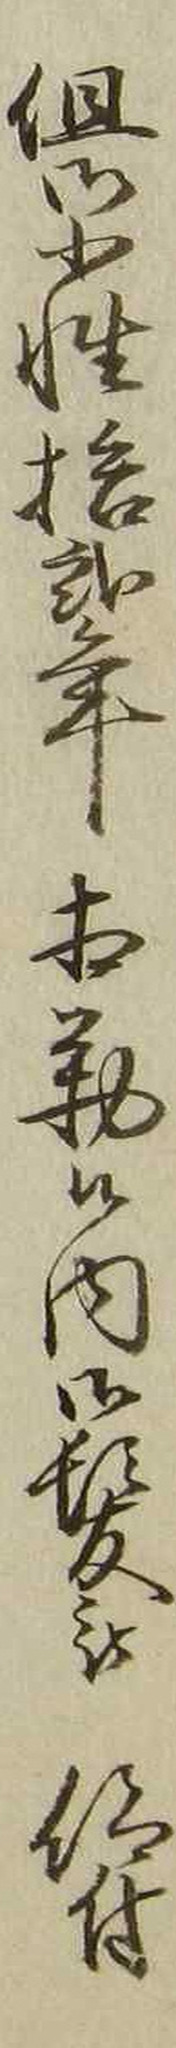但御小姓拾弐年相勤候内御髪被仰付
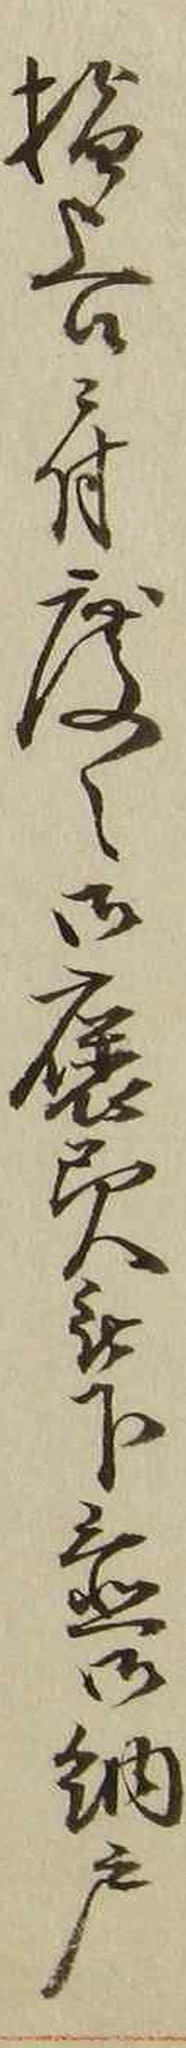指上候ニ付度之御褒美被下置御納戸
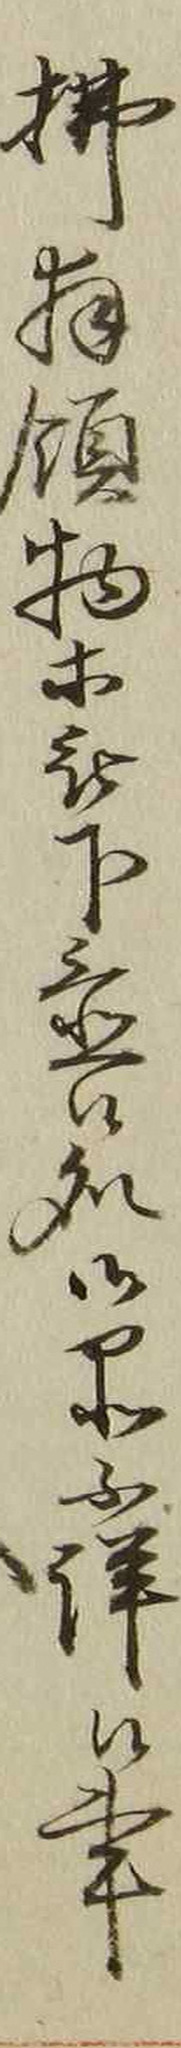払拝領物等被下置候処御品ふ詳候事
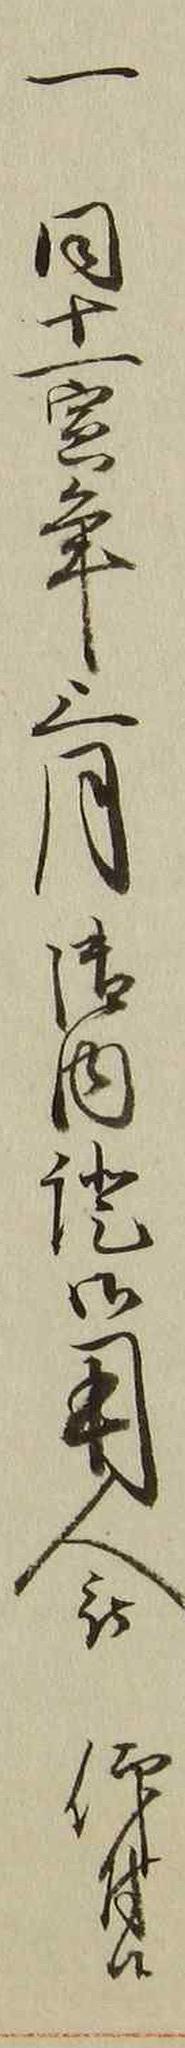一同十一寅年三月御内証御用人被仰付候
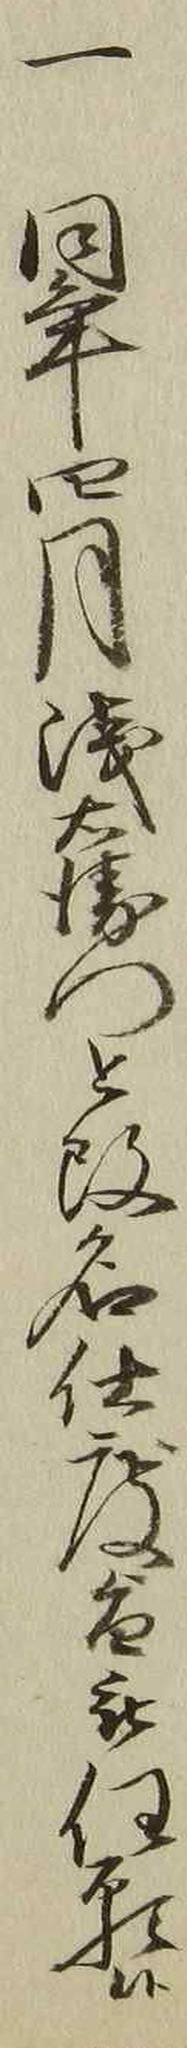一同年四月浅右衛門と改名仕度旨被伺願候
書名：諸士系譜　巻之114　か之部22
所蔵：会津若松市立会津図書館
